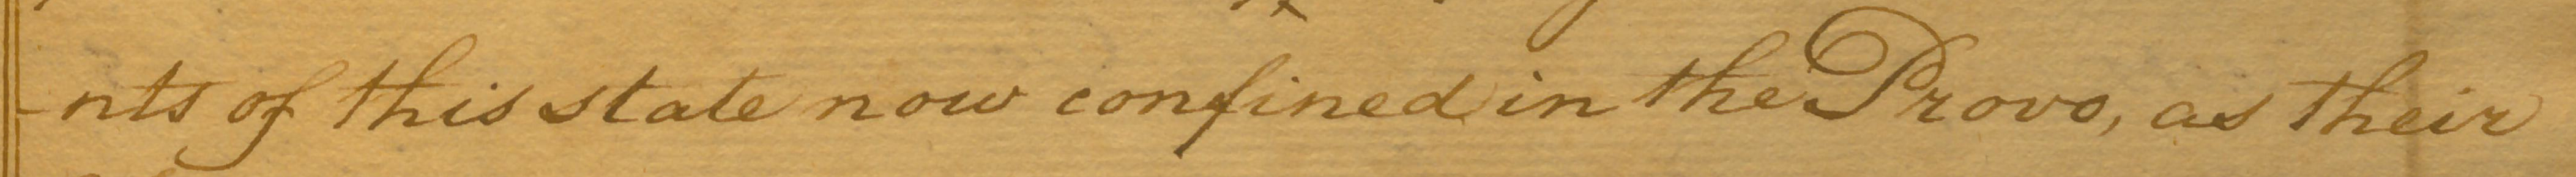nts of this state now confined in the Provo, as their
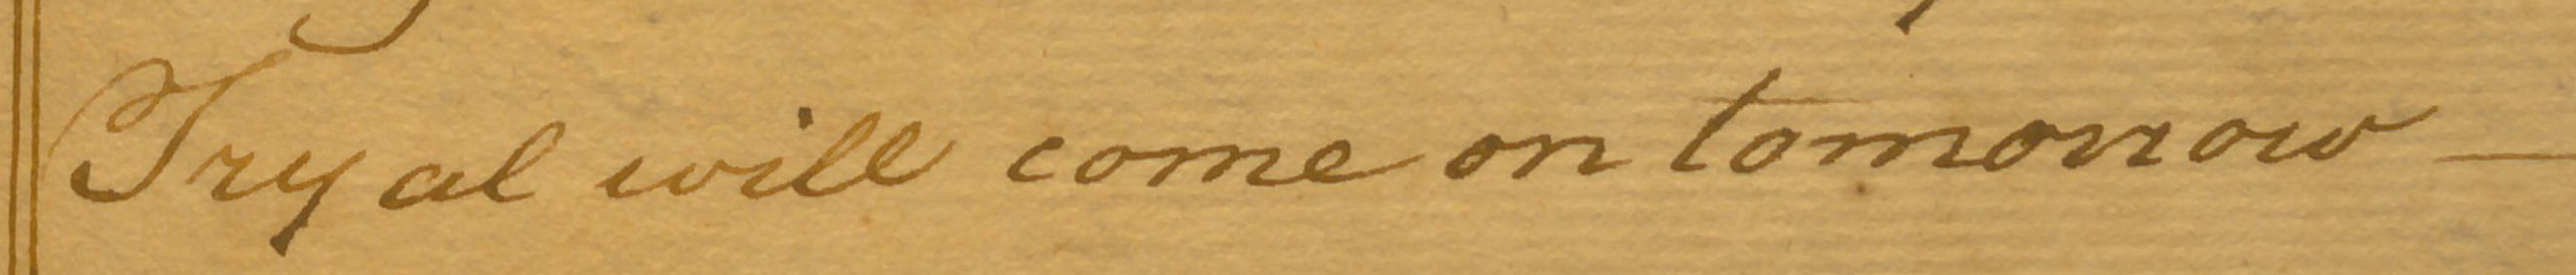Tryal will come on tomorrow-
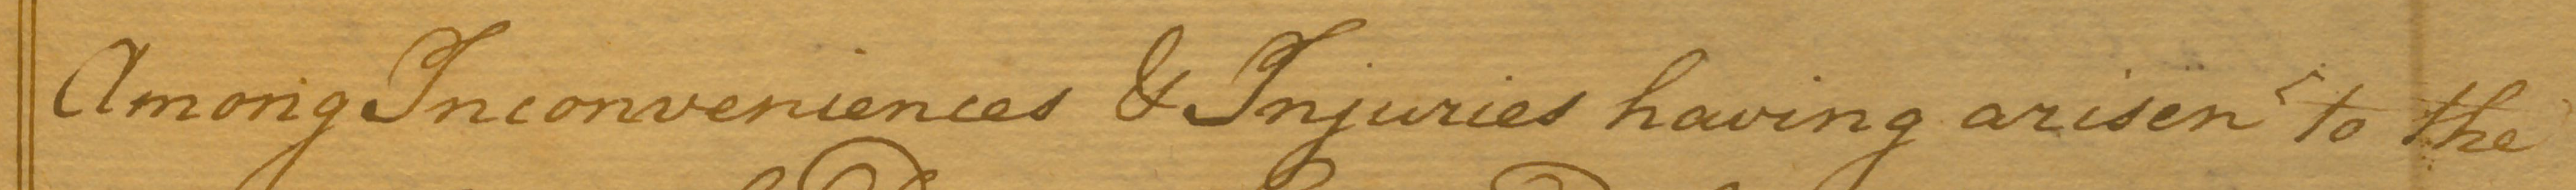Among Inconveniences & Injuries having arisen to the
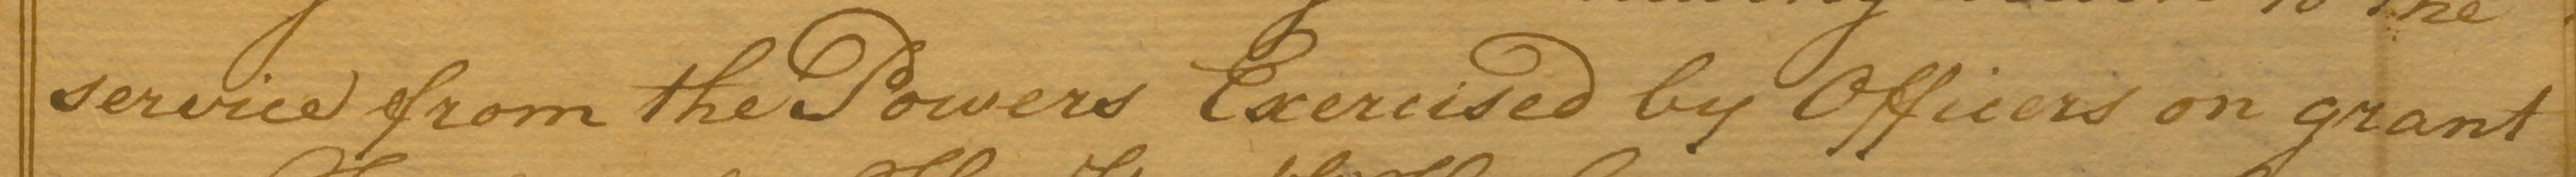service from the Powers Exercised by Officers on grant
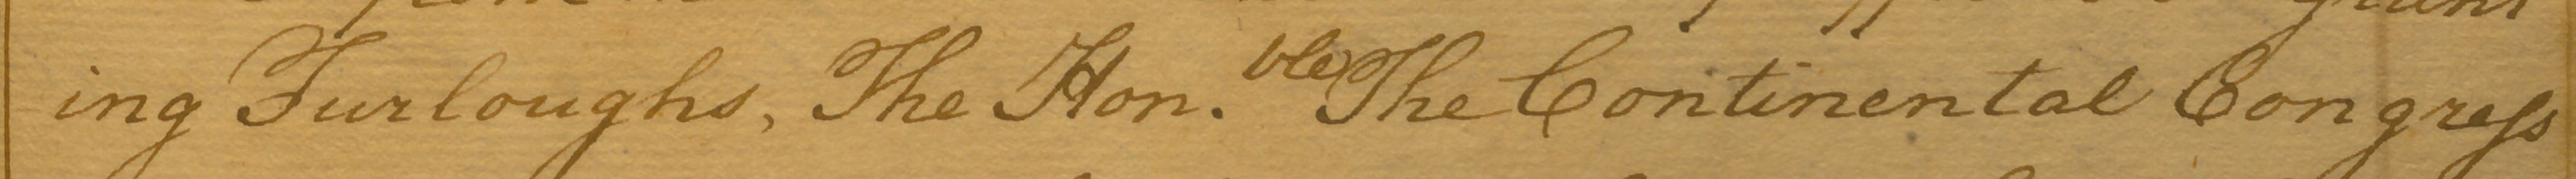ing Furloghs, The Hon^ble. The Continental Congress
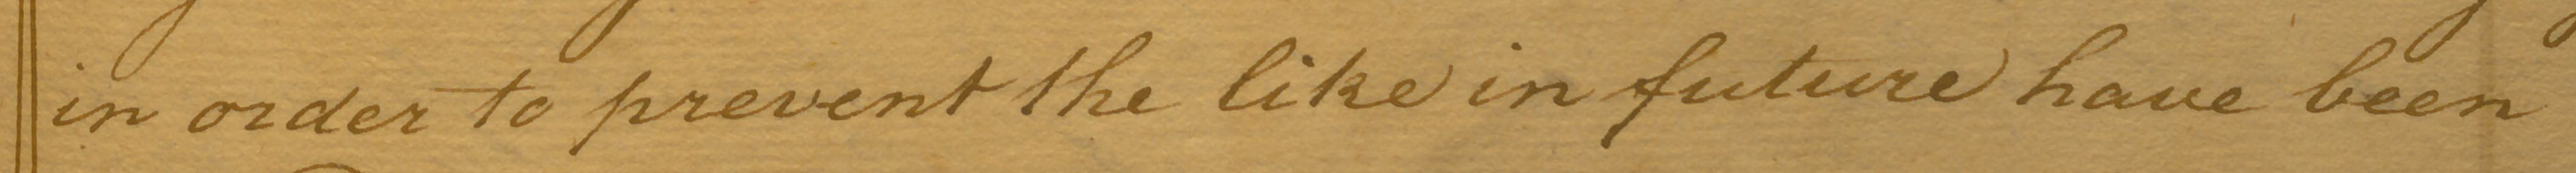in order to prevent the like in future have been
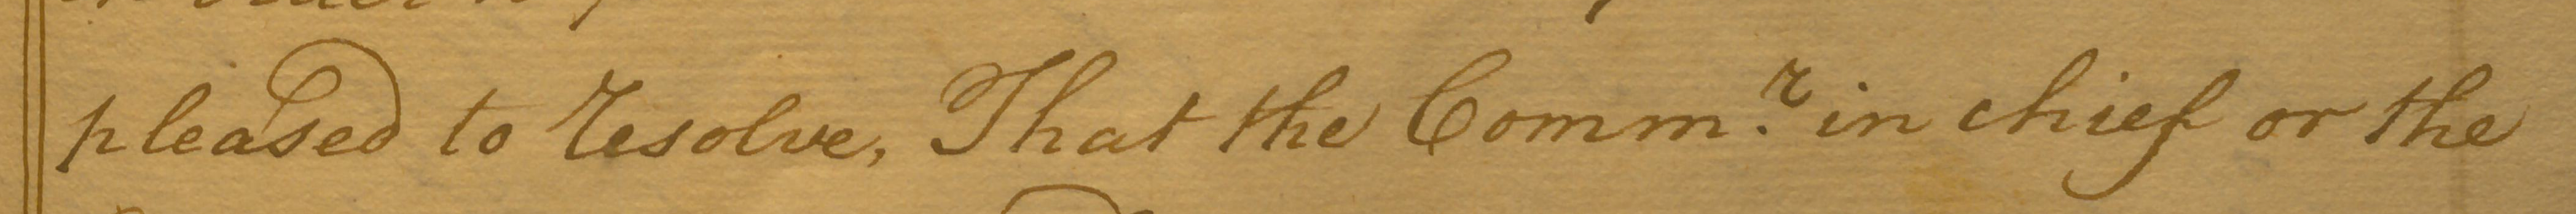pleased to resolve, That the Comm^r. in chief or the
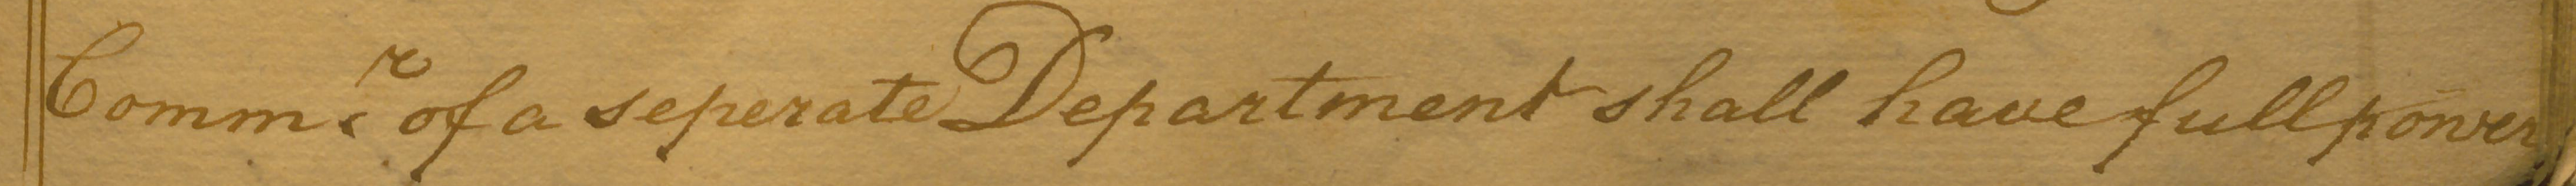Comm^r. of a separate Department shall have full power
